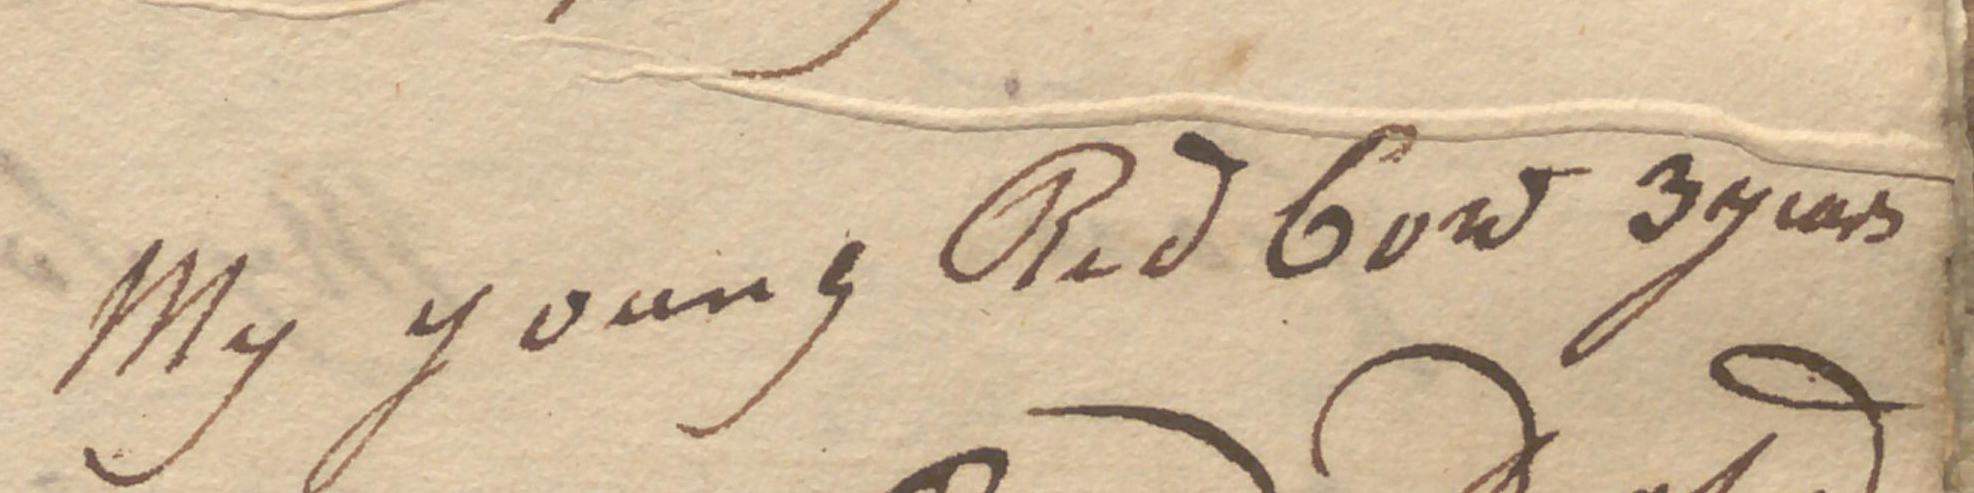young Rid Cow 3 years
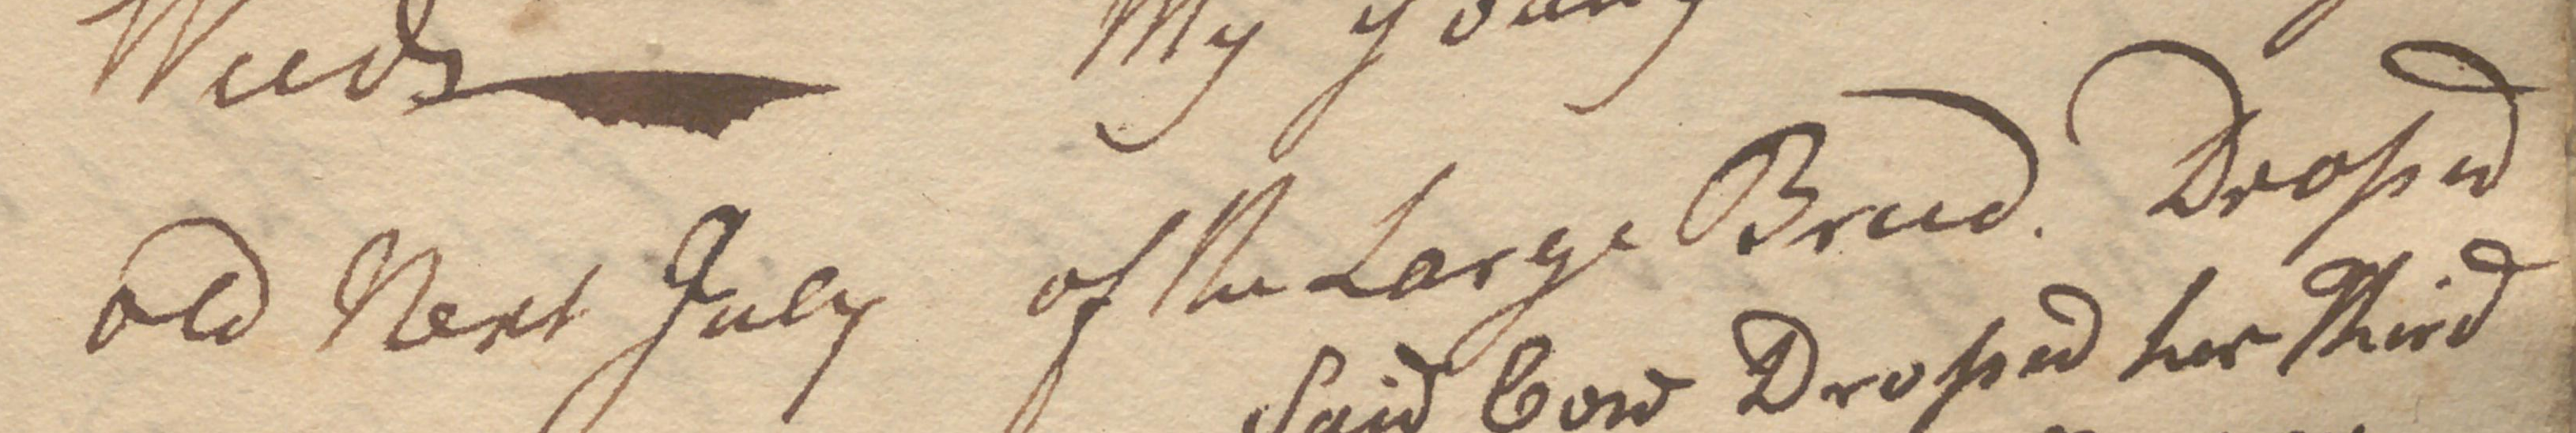old Next July of the Large Breed. Droped
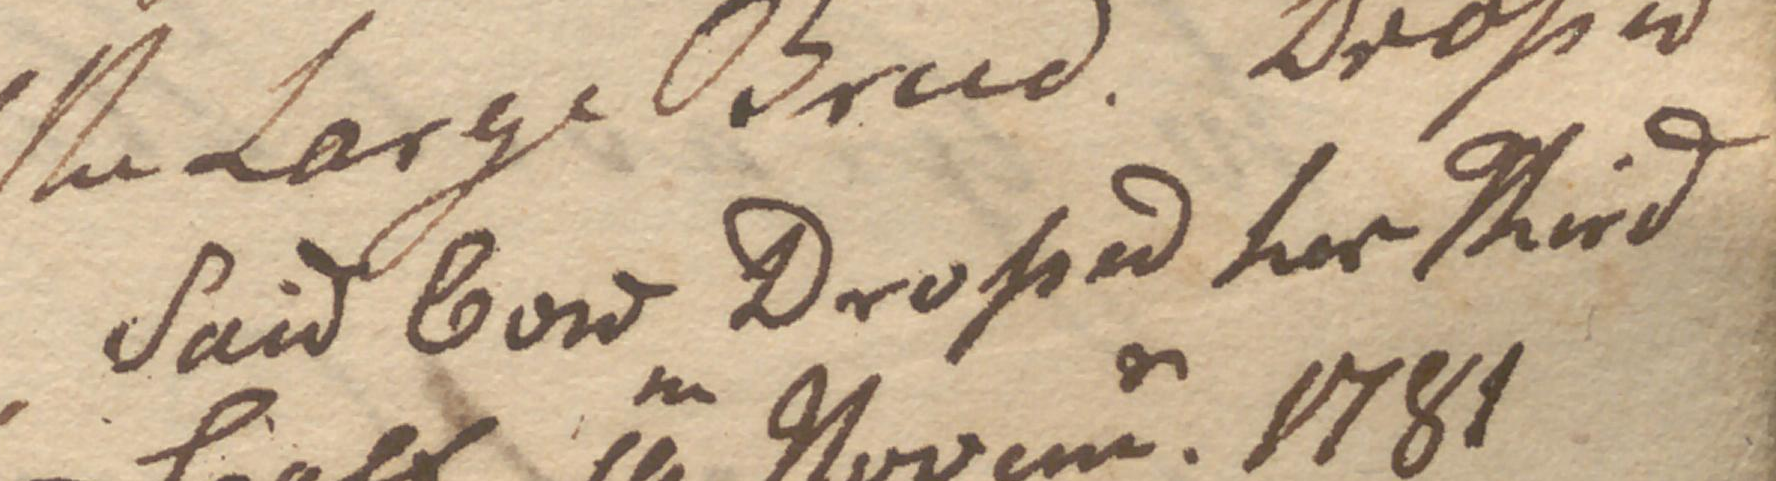Sai Cow Droped her Third
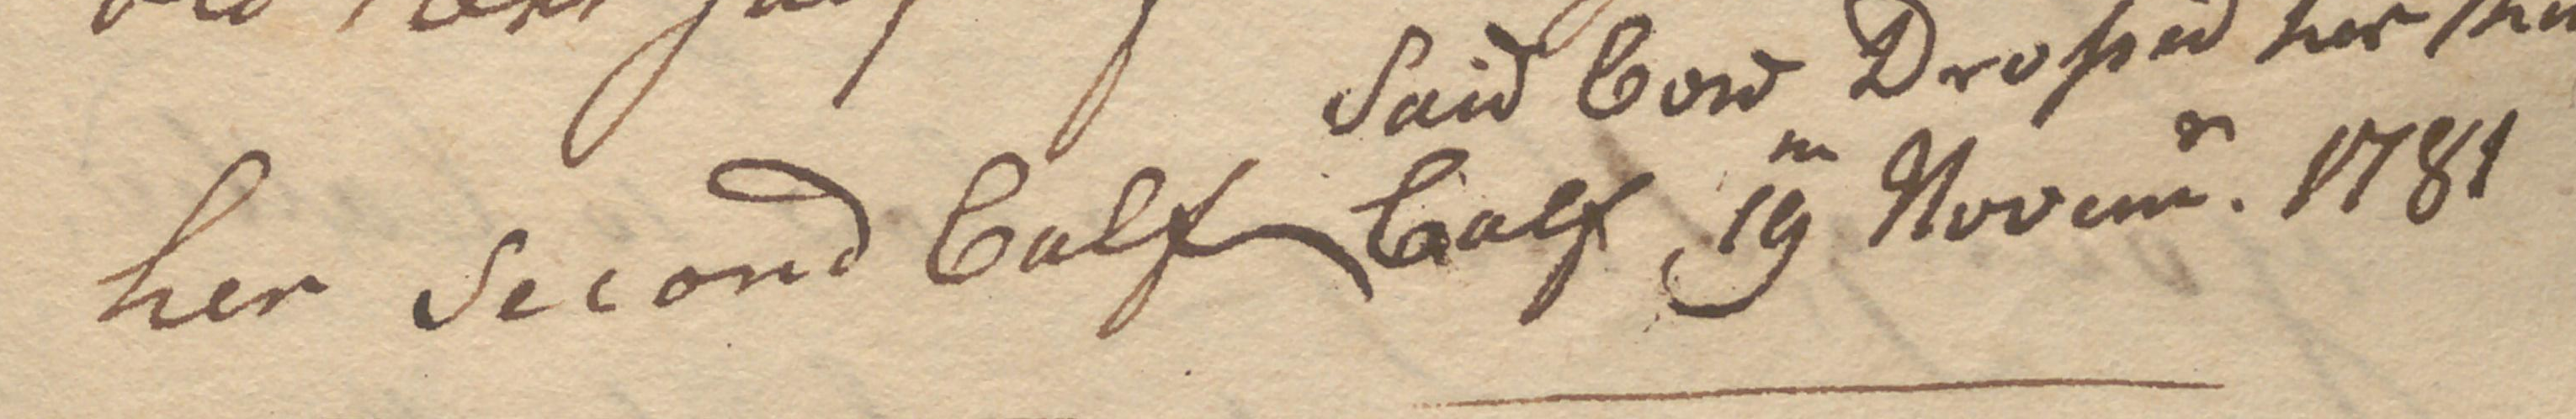her second Calf Calf, 19^th Novem^r. 1781
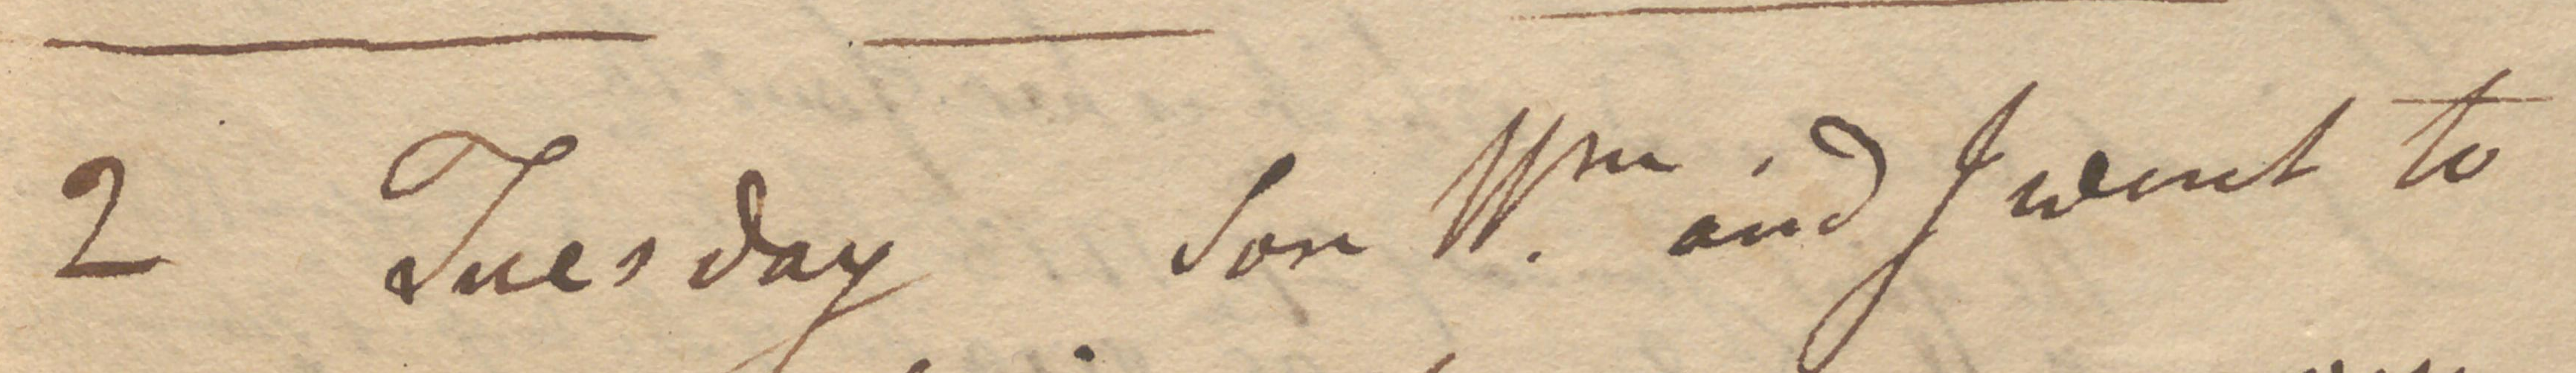2 Tuesday Son W^m. and I went to
